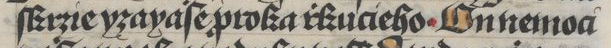ſkrzie yzayaẛe ꝓroka ṙkucieho.On nemoci
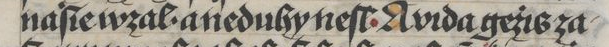naẛie wzal.aneduhy neſl.A vida geżis za¬
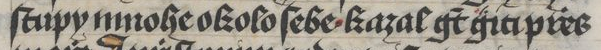ſtupy mnohe okolo ſebe.kazal ḡt gíti pṙes
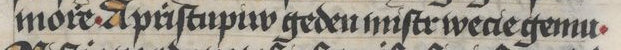moṙe.A pṙiſtupiw geden miſtr wecie gemu.
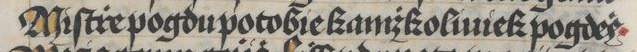Miſtṙe pogdu potobie kamżkoliuiek pogdeṡ.
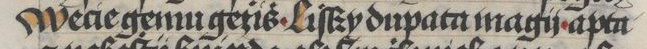Wecie gemu geżiṡ.Liẛky dupata magij.apta¬
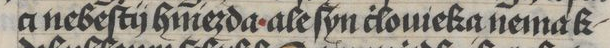ci nebeẛtij hniezda.ale ſyn ċlouieka nema k¬
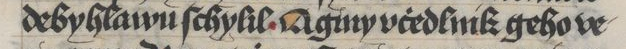deby hlawu ſchylil.A giny vċedlník geho ve¬
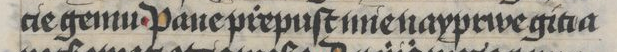cie gemu.Pane pṙepuſt mie nayprwe gíti a
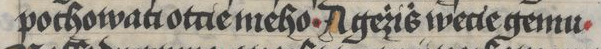pochowati otcie meho.A geżíṡ wecie gemu.
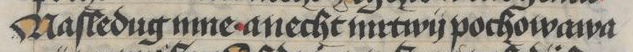Naſledug mne.a necht mrtwij pochowawa¬
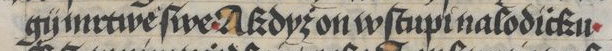gij mrtwe ſwe.Akdyż on wſtupi nalodiċku.
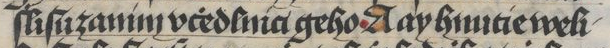ẛli ſu zaním vċedlníci geho.Ay hnutíe weli¬
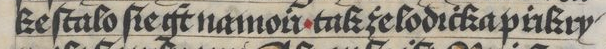ke ſtalo ſie ḡt namoṙi.tak że lodiċka pṙikry¬
